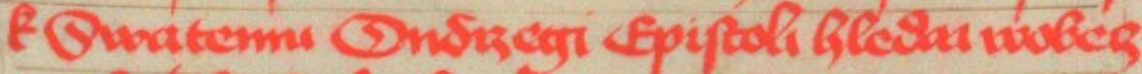k Swatemu Ondrzegi Epiſtoli hledai wobecz-
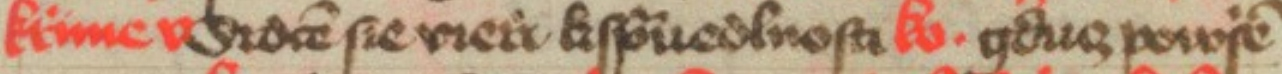kṙinie v Srdcȇ ſie vieṙi kſp̃uedlnoſti ko. gducz powẛe
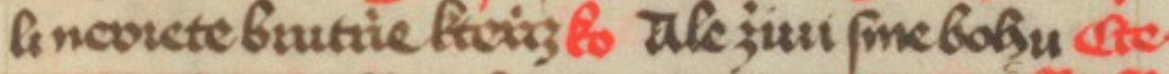li neviete bratṙie kteṙiz ko Ale żiui ſme bohu Ċte
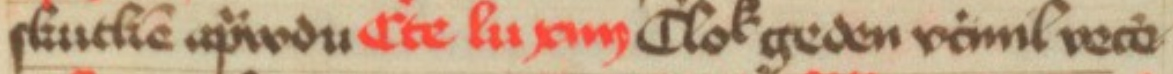ſkutkȇ ap̃wdu Ċte lu xiiij Ċlok geden vċinil veċe-
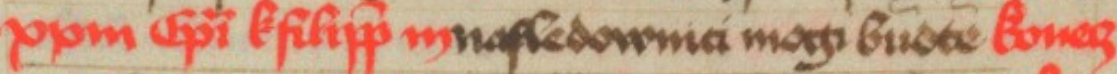xxiii Ep̃i kfilip̑p iij naſledownici magi budte konecz
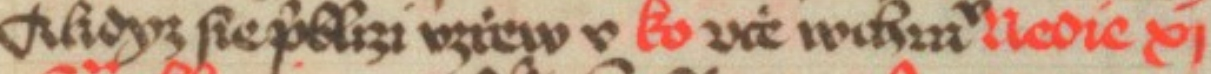Akdyz ſie p̑blizi vzṙew v ko vċe wchrav Nedie xj
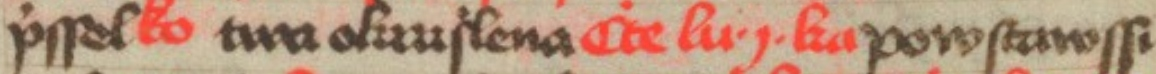ṕſſel ko twa okruẛlena Ċte lu.j.ka powſtawſſi
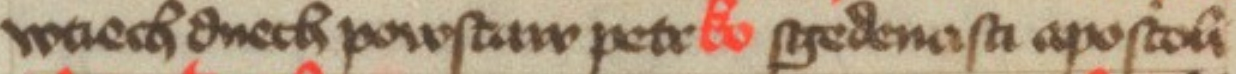wtiech dnech powſtaw petr ko ſgedenaſti apoſtoli
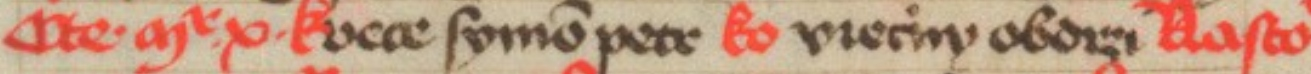Ċte. mt.x.k. vece ſymȏ petr ko vieċny obdrzi Raſto.ci
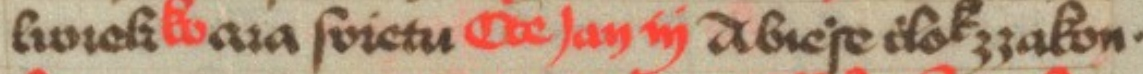lwiek aia ſvietu Ċte Jan iij Abieẛe člok zzakon.
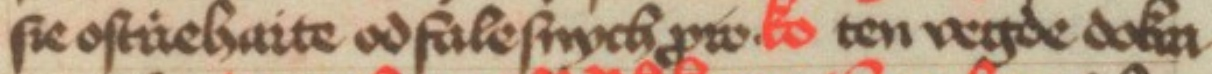ſie oſtṙiehaite od faleẛnych ꝓro.ko ten vegde dokra-
